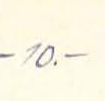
10.
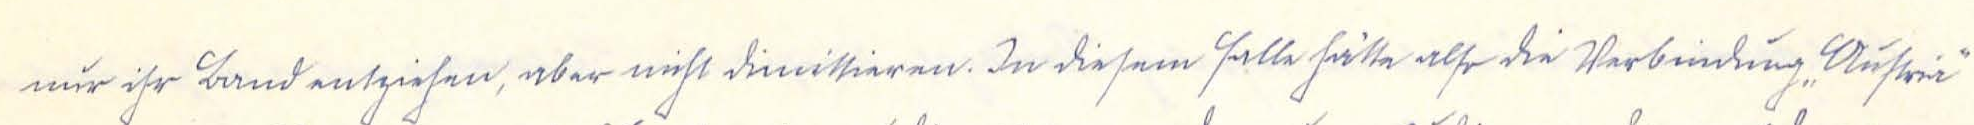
nur ihr Band entziehen aber nicht dimittieren. In diesem Falle hätte also die Verbindung "Austria"
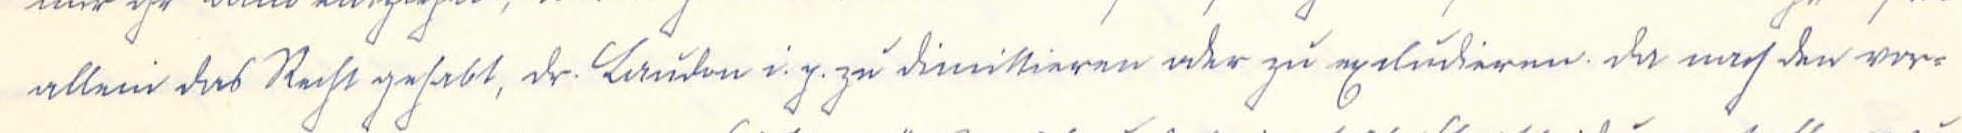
allein das Recht gehabt, Dr. Laudon i. p. zu dimittieren aber zu excludieren da nach den vor-
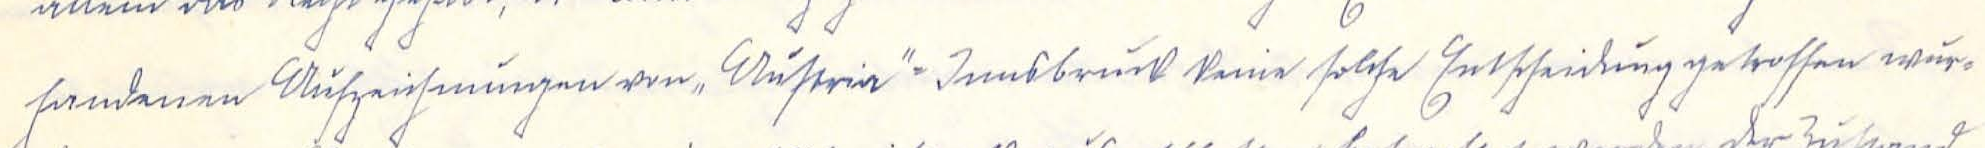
handenen Aufzählungen von "Austria" - Innsbruck keine solche Entscheidung getroffen wur-
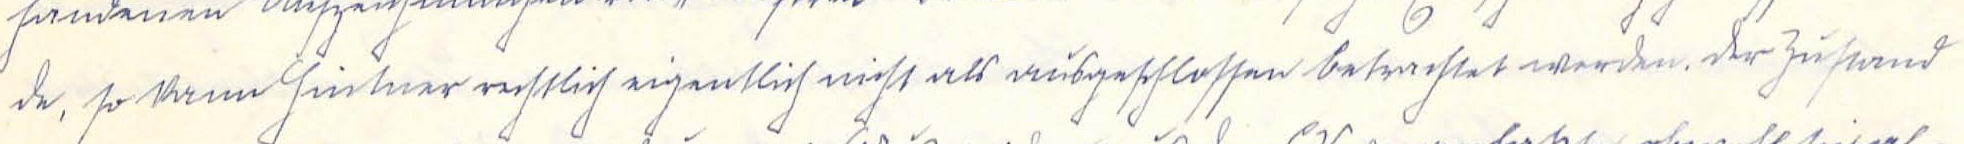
de, so kam Hintner rechtlich eigentlich nicht als ausgeschlossen betrachtet werden. Der Zustand
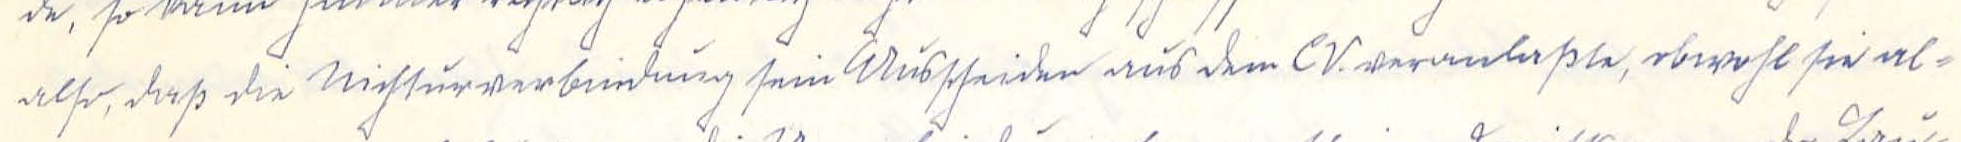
also, daß die Nichturverbindung sein Ausscheiden aus dem CV. veranlaßte, obwohl sie al-
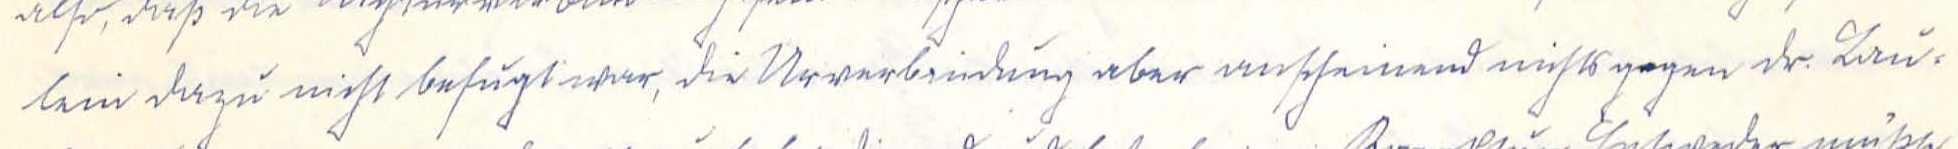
lein dazu nicht befähigt war, die Urverbindung aber anscheinend nichts gegen Dr. Lau-
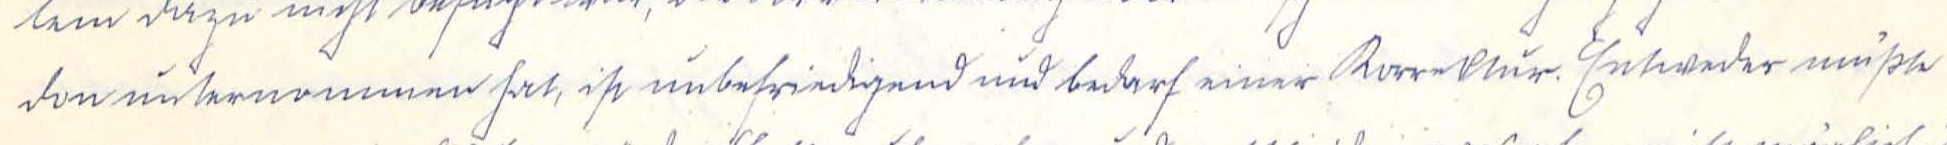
don unternommen hat, ist unbefriedigend und bedarf einer Korrektur. Entweder müßte
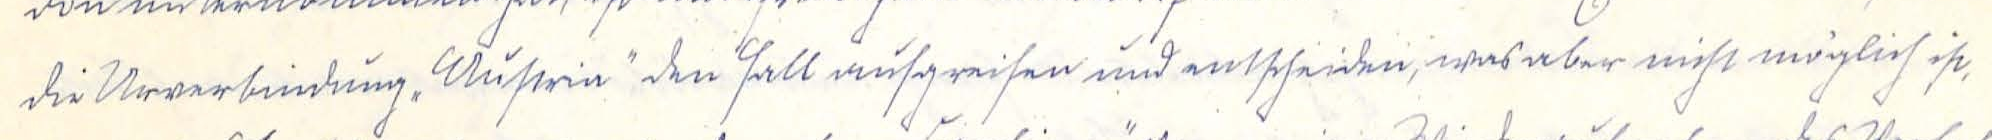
die Urverbindung "Austria" den Fall aufgreigen und entscheiden, was aber nicht möglich ist,
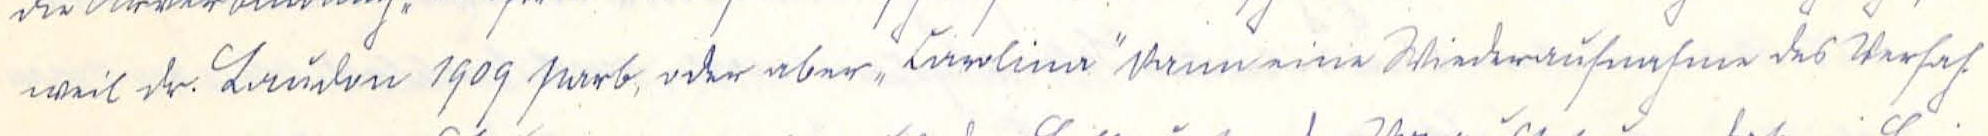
weil Dr. Laudon 1909 starb, oder aber "Carolina" kann eine Wiederaufnahme des Verfah-
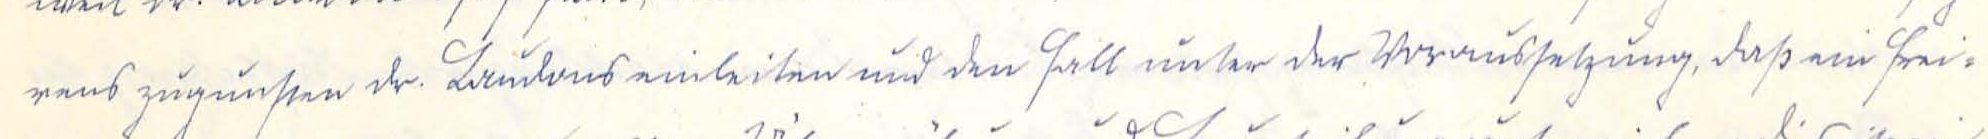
rens zugunsten Dr. Laudons einleiten und den Fall unter der Voraussetzung, daß ein Frei-
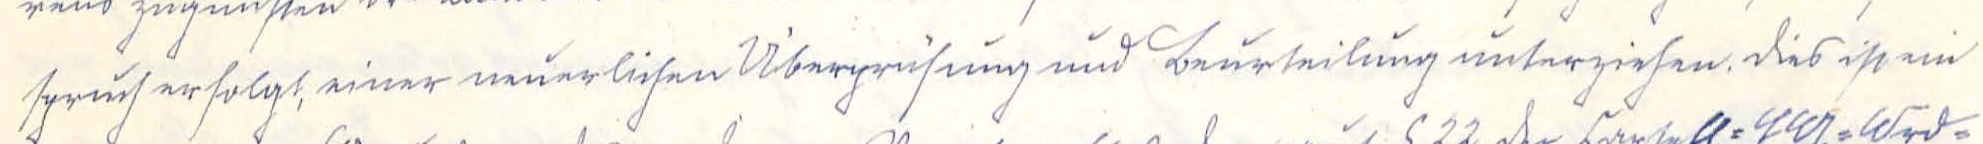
spruch erfolgt, einer neuerlichen Überprüfung und Beurteilung unterziehen. Dies ist ein
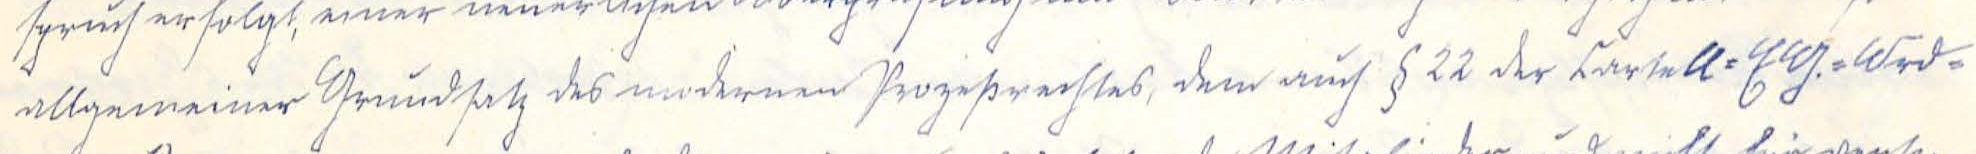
allgemeiner Grundsatz des modernen Prozessrechtes, dem auch §22 der Cartell-EG-Ord-
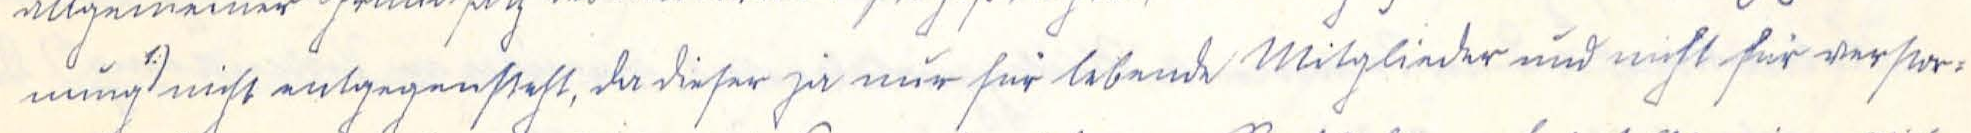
nung 1.) nicht entgegensteht, da dieser ja nur für lebende Mitglieder und nicht für verstor-
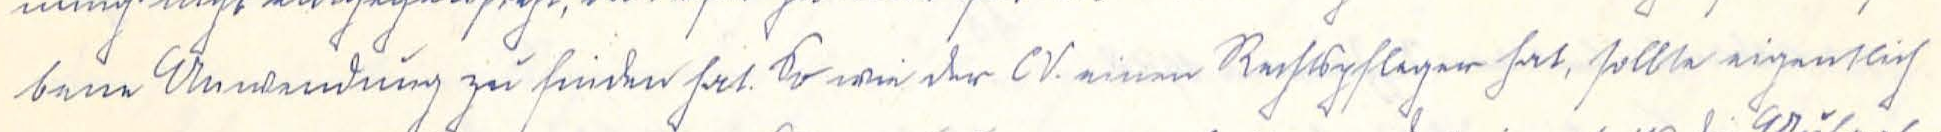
bene Anwendung zu finden hat. So wie der CV einen Rechtspfleger hat, sollte eigentlich
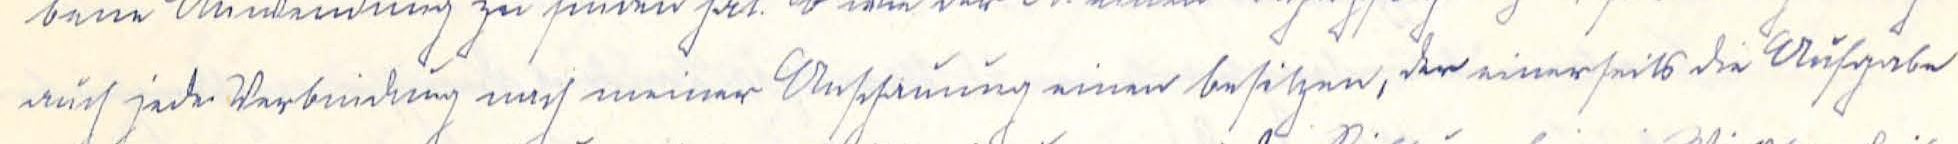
auch jede Verbindung nach meiner Anschauung einen besitzen, der einerseits die Aufgbae
